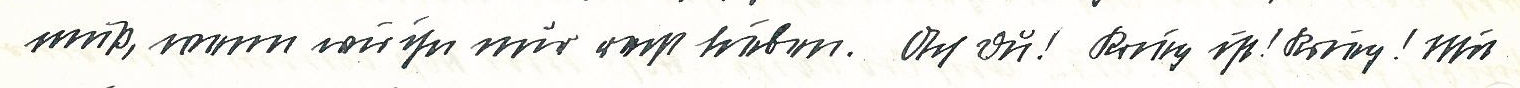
muss, wenn wir ihn nur recht lieben. Ach Du! Krieg ist! Krieg! Mit
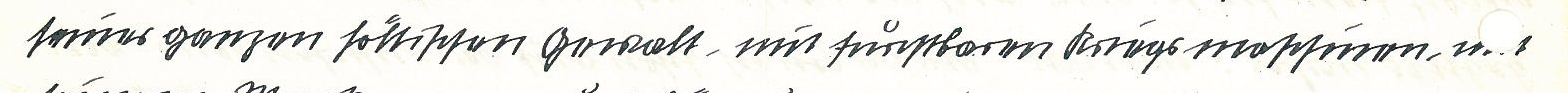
seiner ganzen höllischen Gewalt, mit furchtbaren Kriegsmaschinen, mt
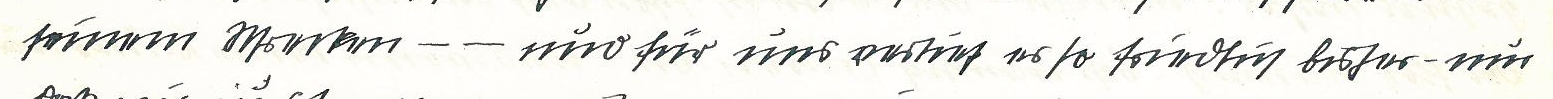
seinem Schrecken – – und für uns verlief es so friedlich bisher – nur
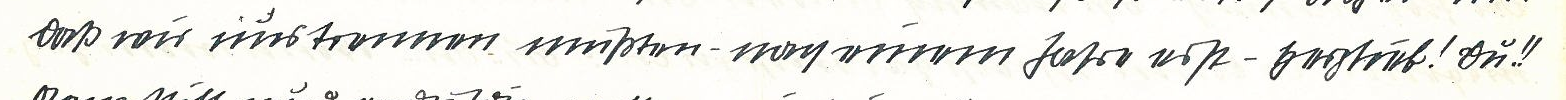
daß wir uns trennen mußten – nach einem Jahre erst – Herzlieb! Du!!
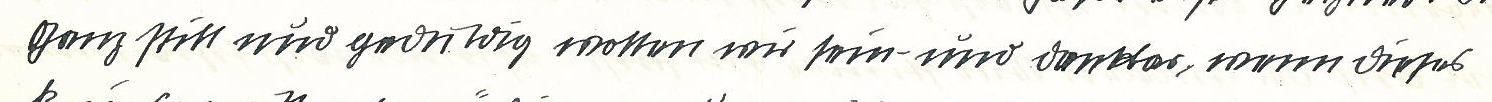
Ganz still und geduldig wollen wir sein – und dankbar, wenn dieses
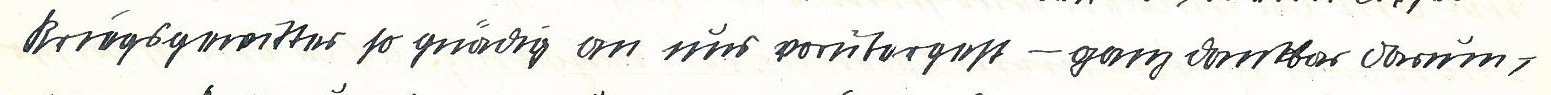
Kriegsgewitter so gnädig an uns vorüber geht – ganz dankbar darum,
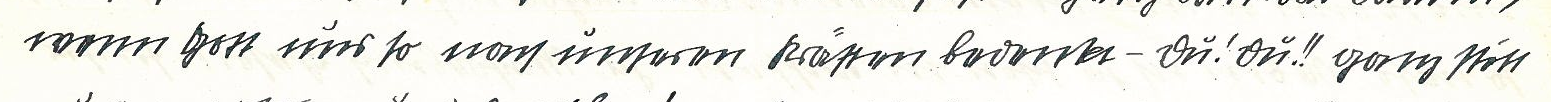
wenn Gott uns so nach unseren Kräften bedenkt – Du! Du!! Ganz still
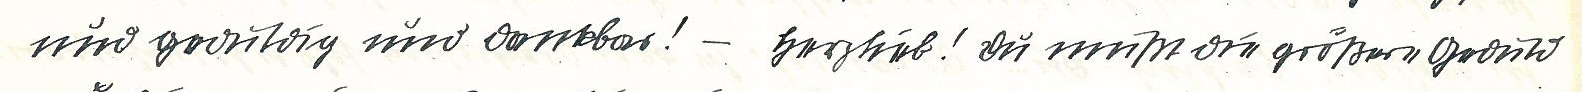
und geduldig und dankbar! – Herzlieb! Du mußt die größte Geduld
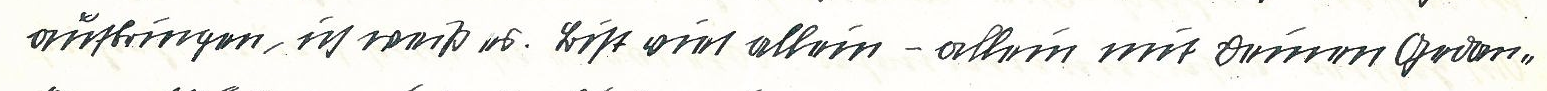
aufbringen, ich weiß es. Bist viel allein, – allein mit Deinen Gedan¬
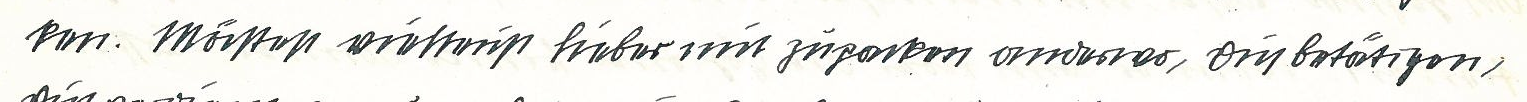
ken. Möchtest vielleicht lieber mit zupacken anderswo, Dich betätigen,
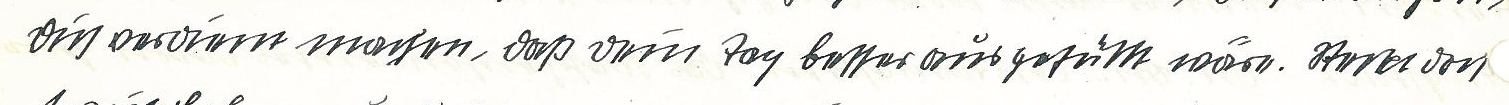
Dich verdient machen, daß dein Tag besser ausgefüllt wäre. Steckt doch
